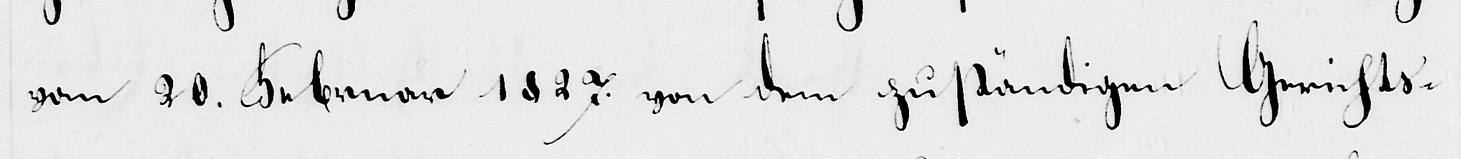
vom 20. Februar 1827. von dem zuständigen Gerichts¬
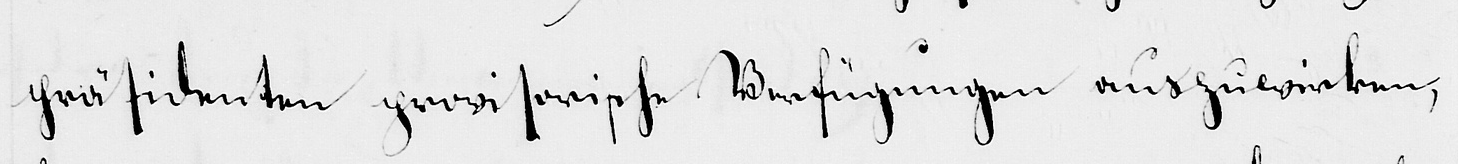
präsidenten provisorische Verfügungen auszuwirken,
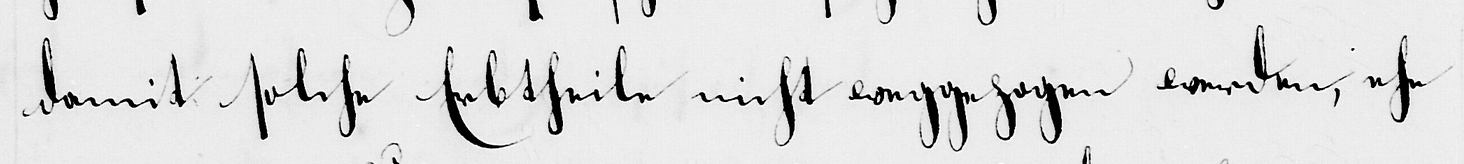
damit solche Erbtheile nicht weggezogen werden, ehe
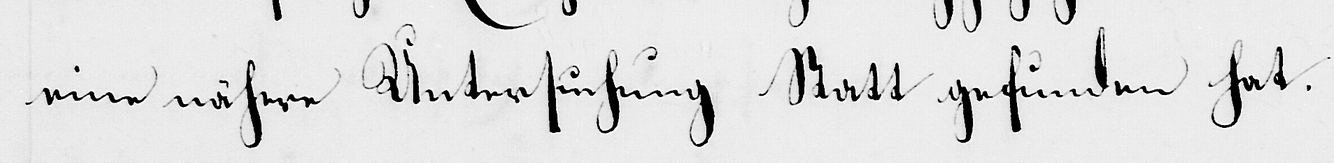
eine nähere Untersuchung Statt gefunden hat.
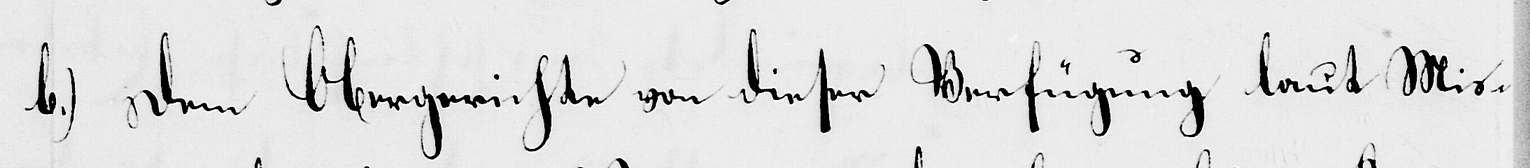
b.) dem Obergerichte von dieser Verfügung laut Mis¬
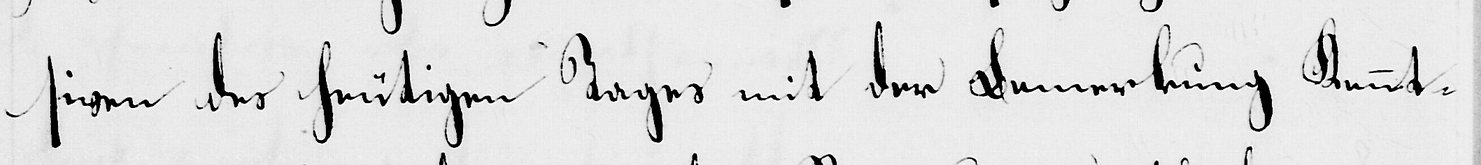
siven des heutigen Tages mit der Bemerkung Kennt¬
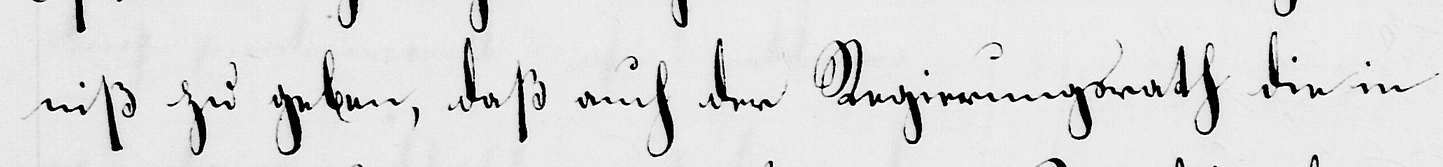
niß zu geben, daß auch der Regierungsrath die in
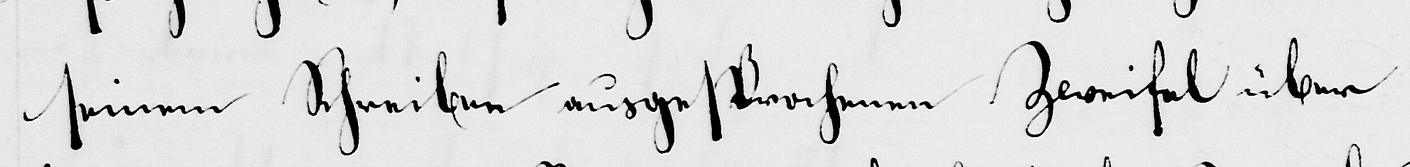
seinem Schreiben ausgesprochenen Zweifel über
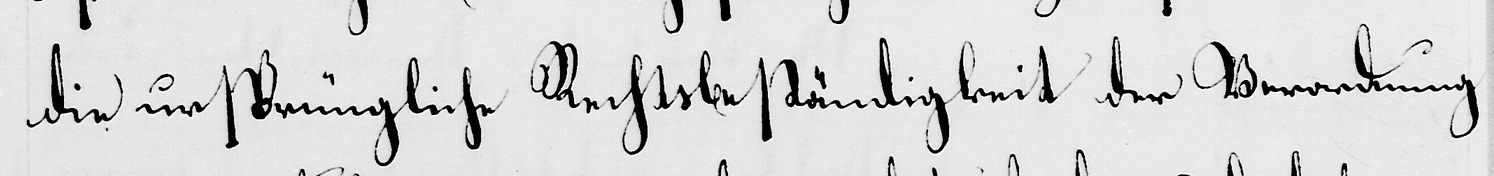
die ursprüngliche Rechtsbeständigkeit der Verordnung
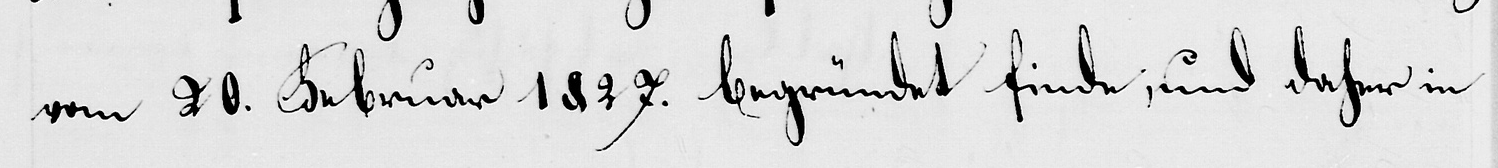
vom 20. Februar 1827. begründet finde, und daher in
